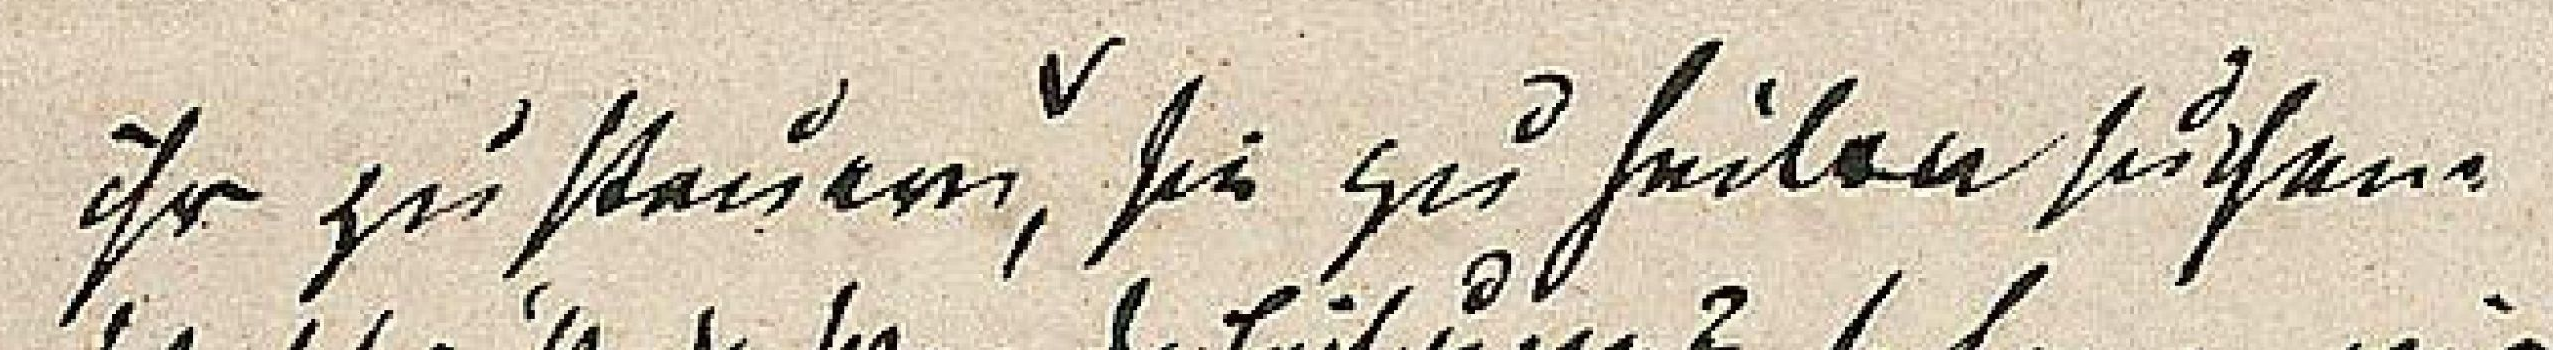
ihr zu steuern, sie zu heilen suchen.
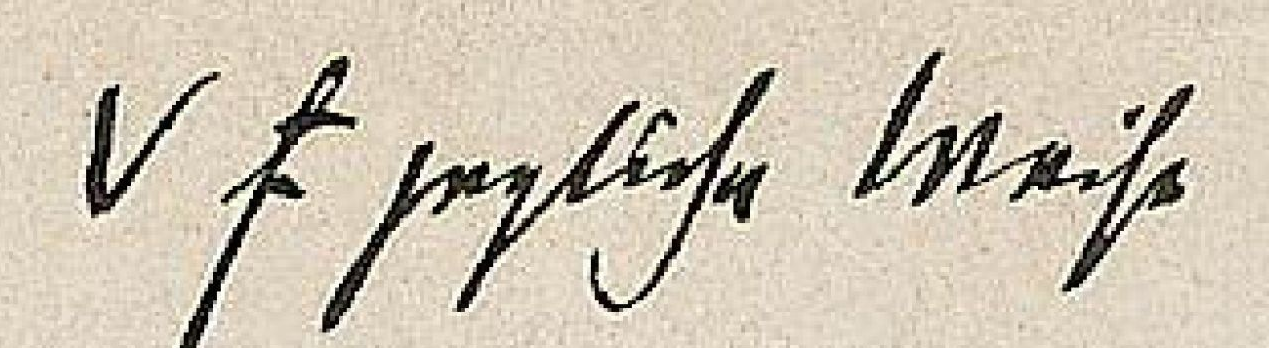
V f jegliche Weise
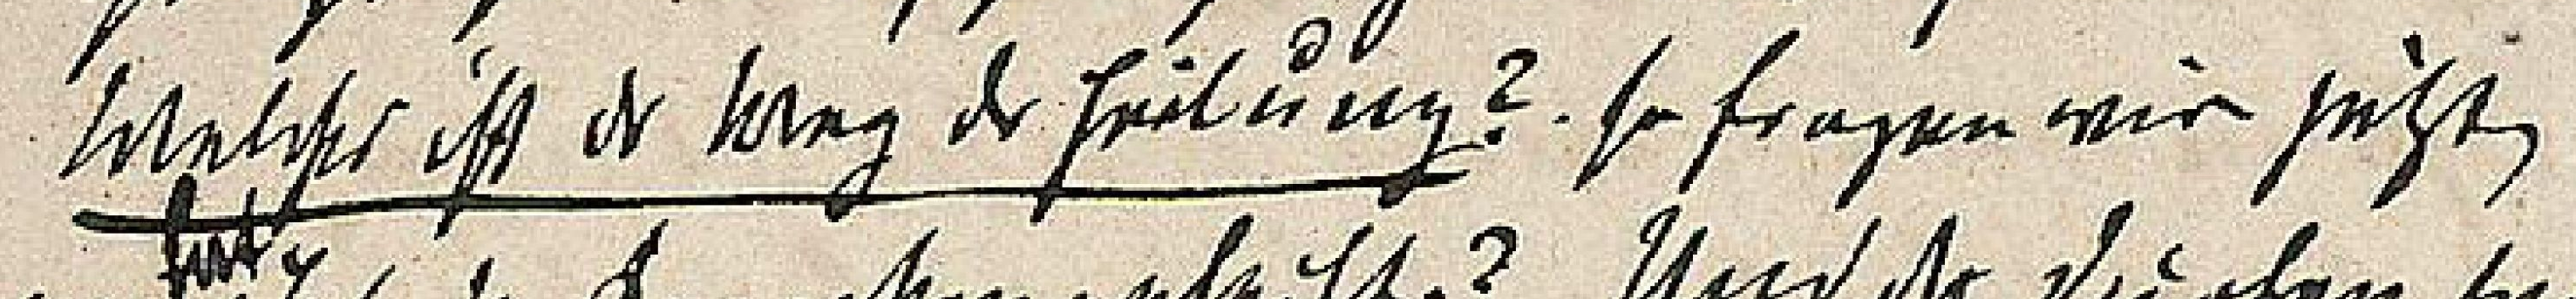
Welches ist dr Weg dr Heilung? so fragen wir jetzt,
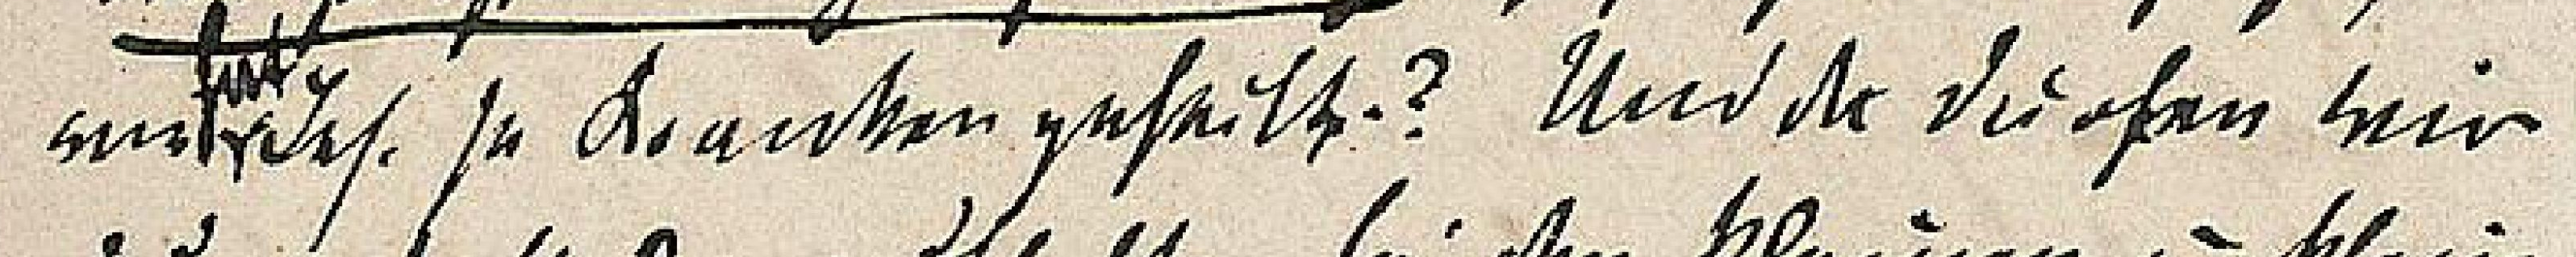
wie hat Jes. sn Kranken geheilt? Und da dürfen wir
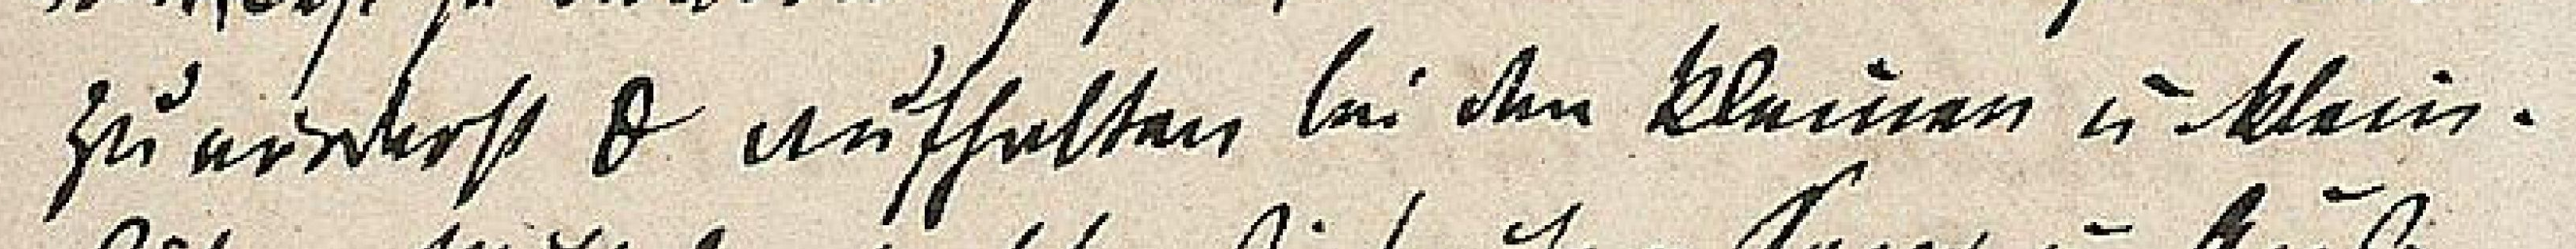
zumindest o aufhalten bei den kleinen u. klein¬
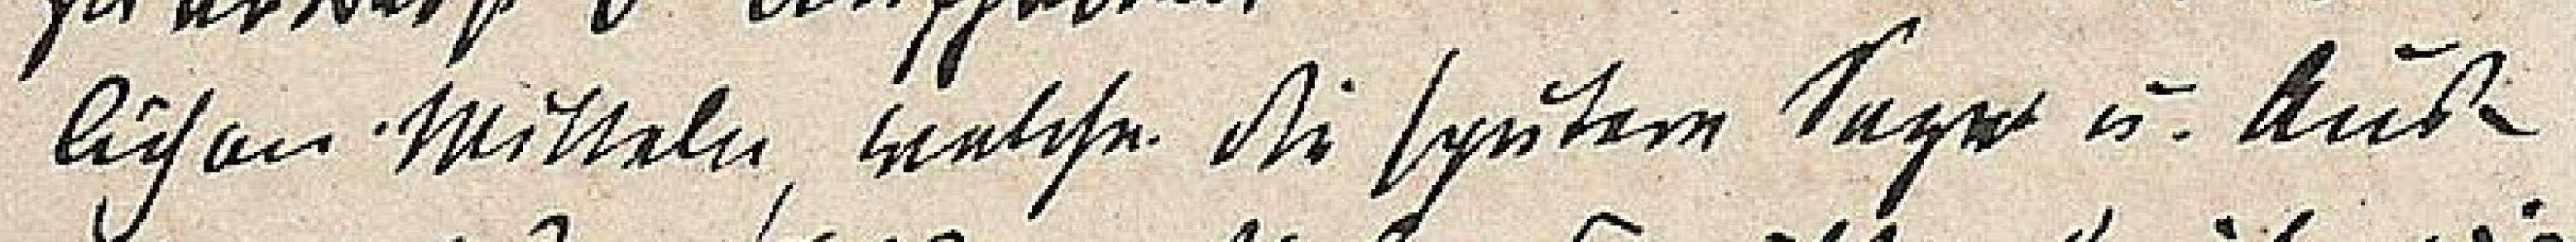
lichen Mitteln, welche die spätere Sage u. Aus¬
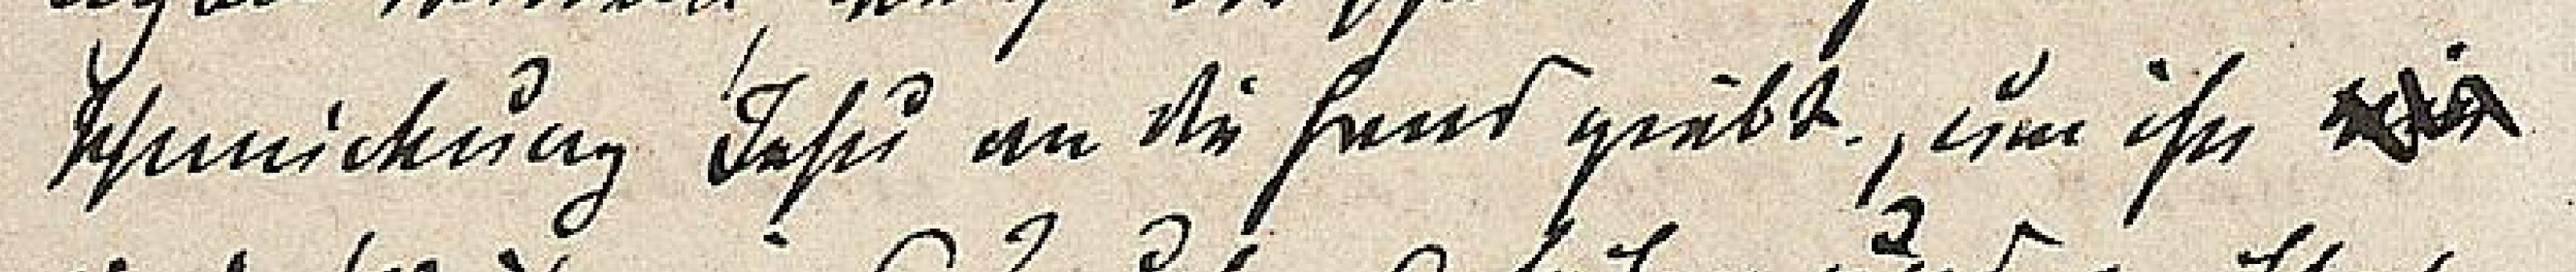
schmückungen Jesu an die Hand giebt, um ihn wie
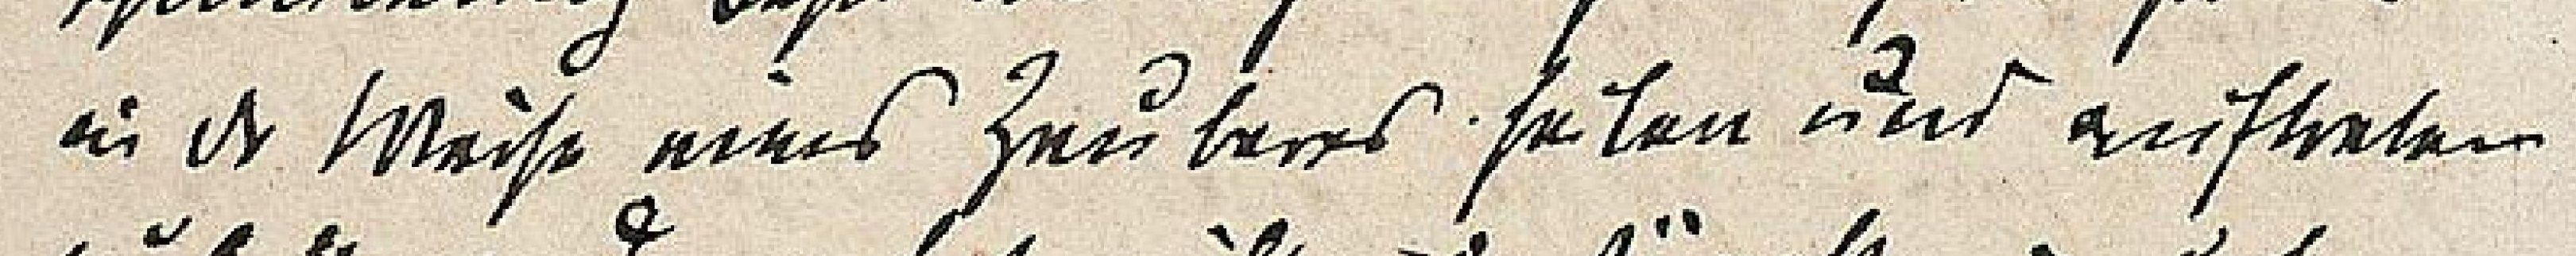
in dr Weis eines Zauberers heielen und auftreten
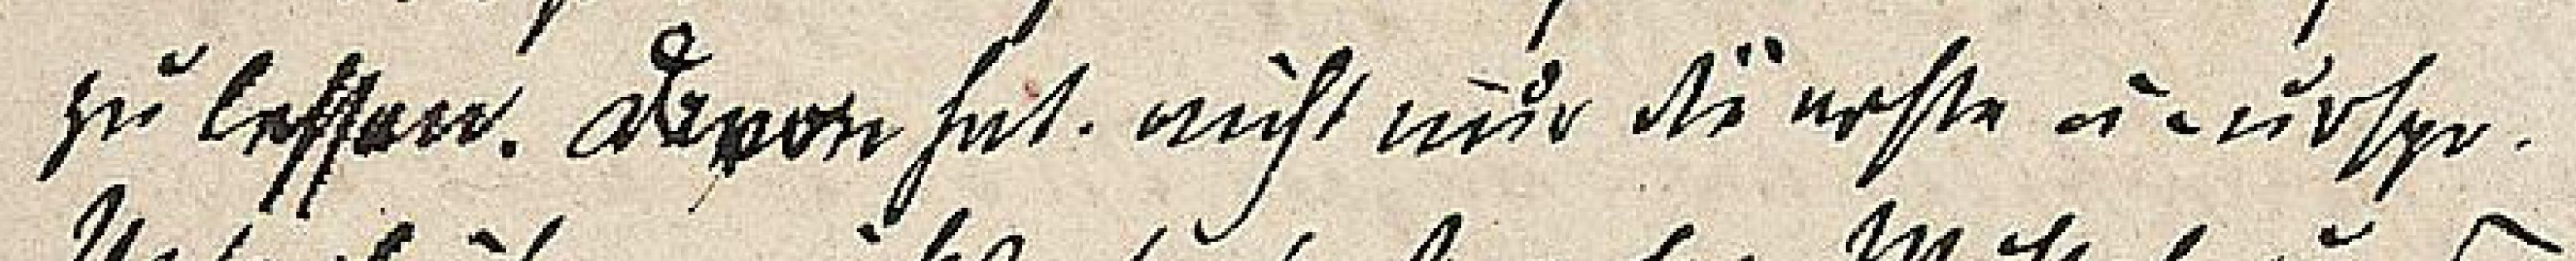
zu lassen. Davon hat. nicht nur die erste u. urspr.
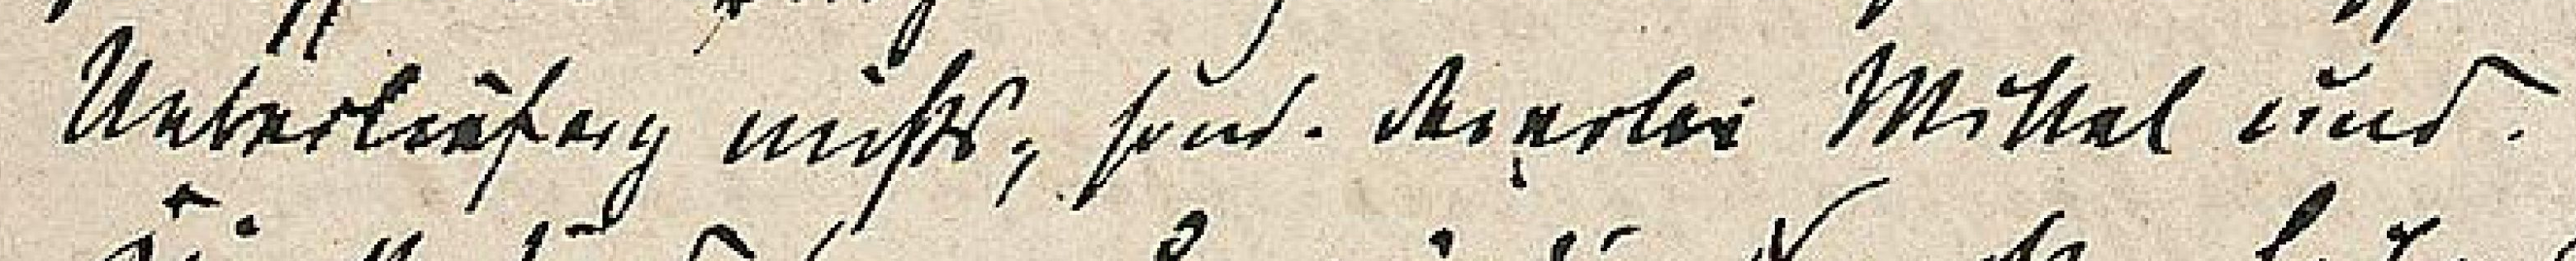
Ueberlieferung nichts, sond. dererlei Mittel und
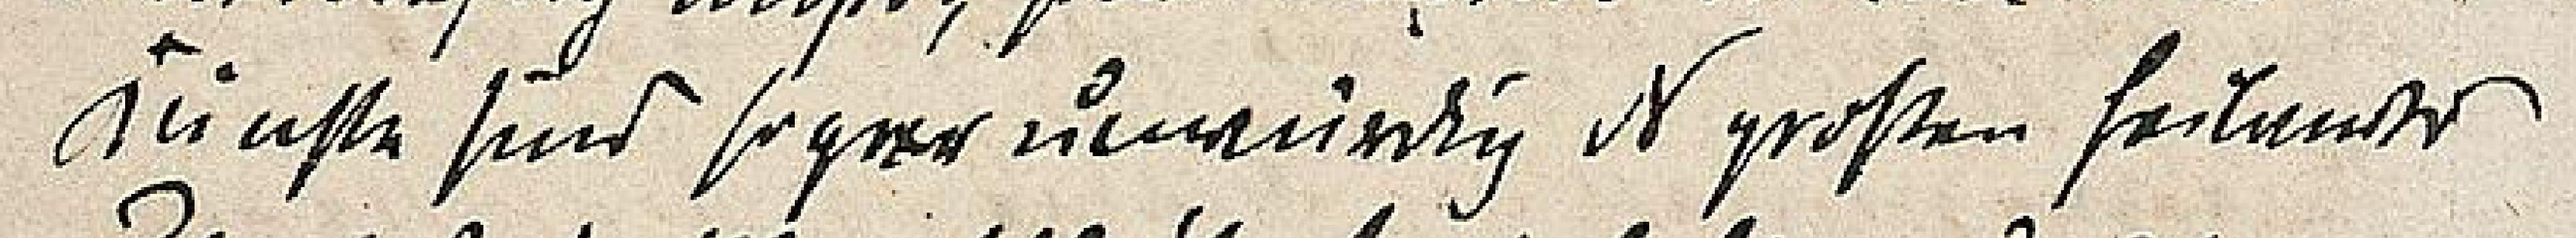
Künste sind sogar unwürdig das größten Heilands
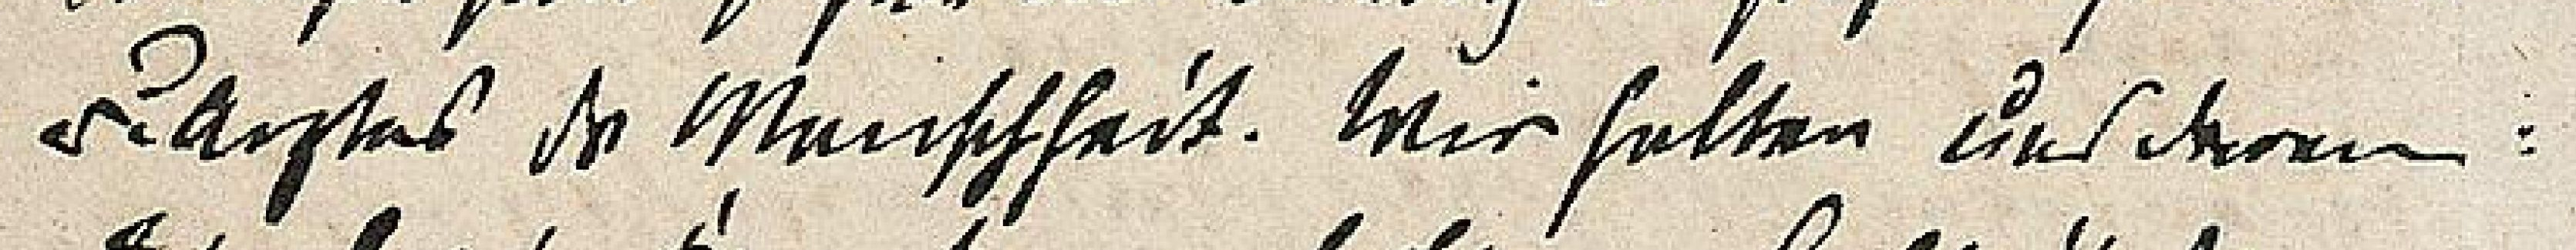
u. Arztes dr Menschheit. wir halten und daran:
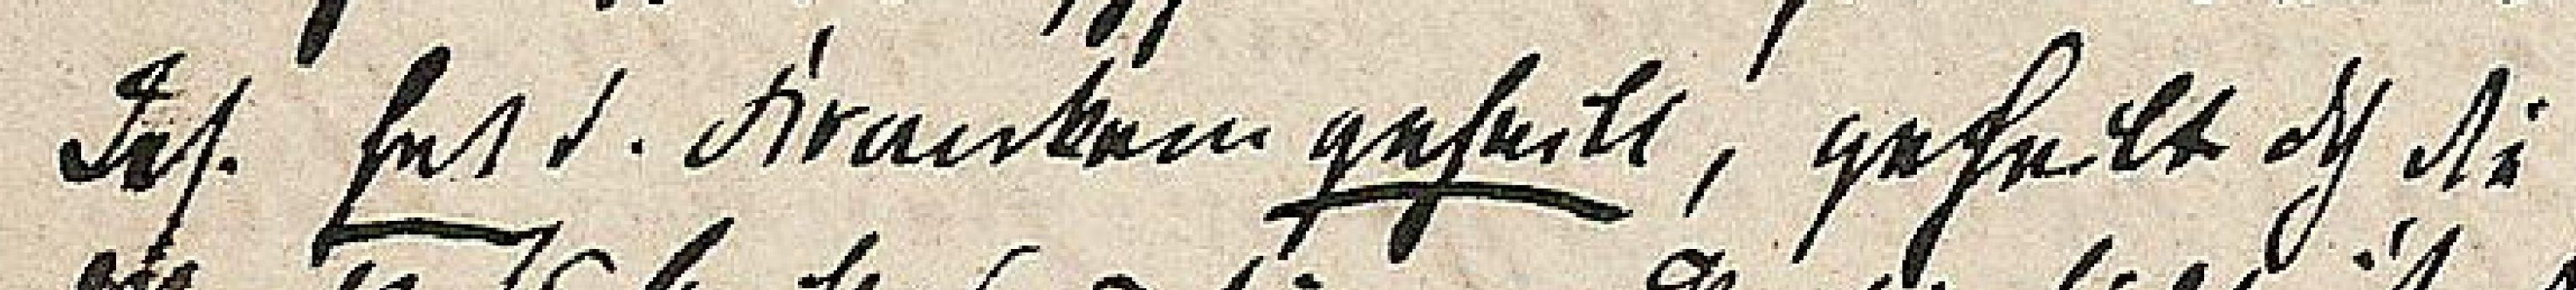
Jes. hat d. Kranken geheilt, geheilt dch die
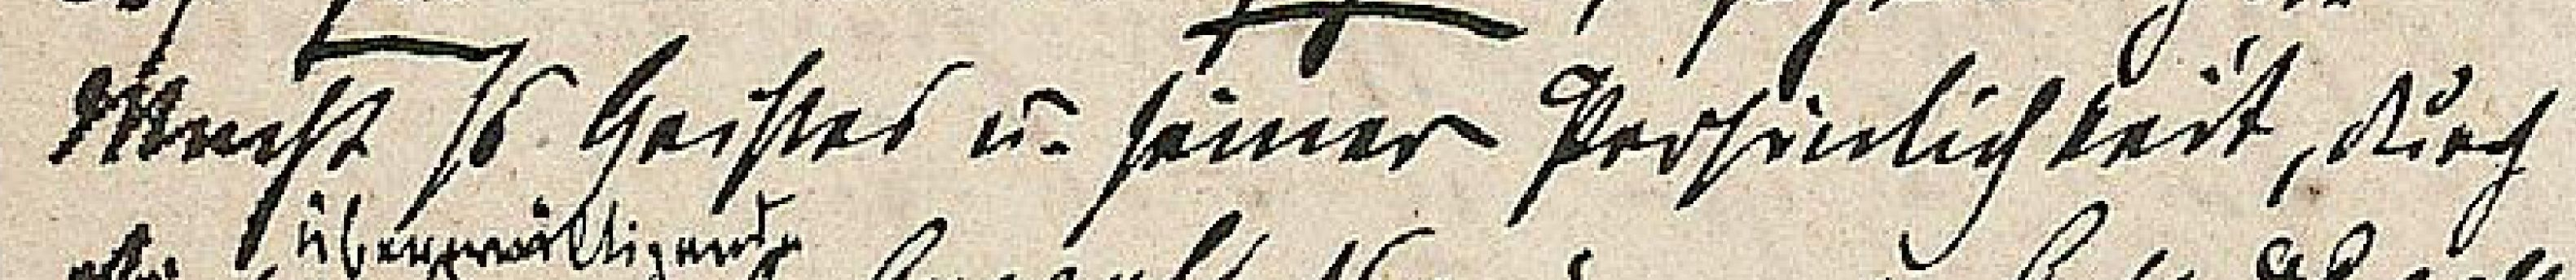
Macht ss Geistes u. seiner Persönlichkeit, durch
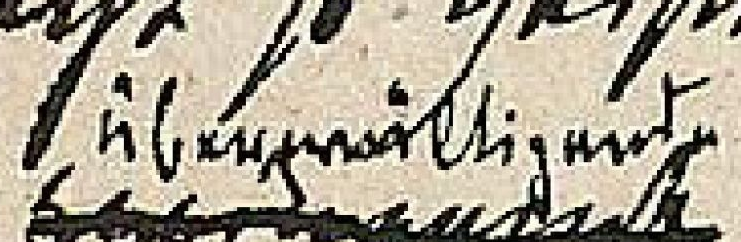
überwältigende
